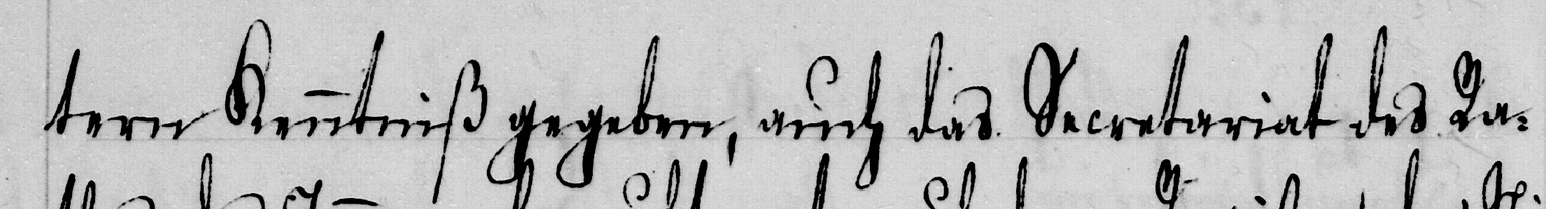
tern Kenntniß gegeben, auch das Secretariat des Ra¬
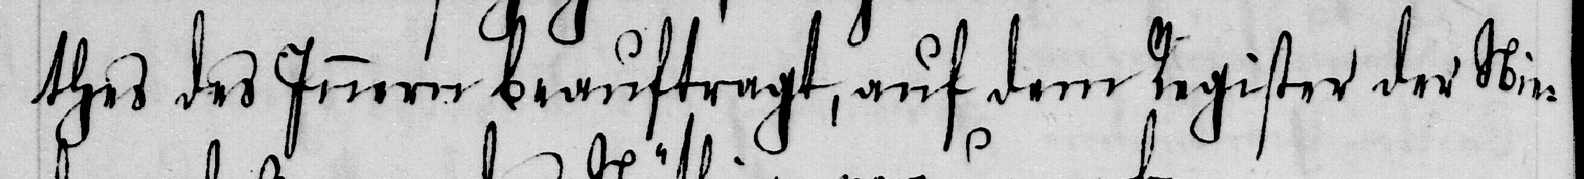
thes des Innern beauftragt, auf dem Register der Nie¬
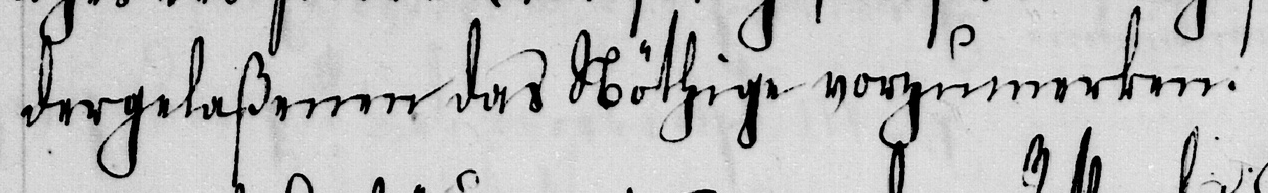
dergelaßenen das Nöthige vorzumerken.
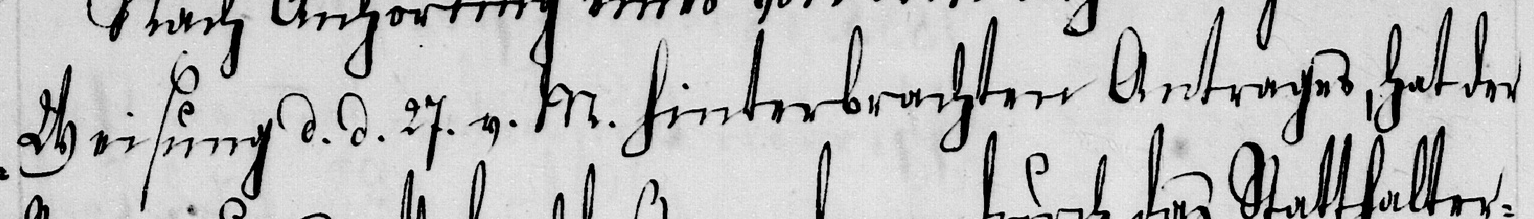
Weisung d. d. 27. v. M. hinterbrachten Antrages, hat der
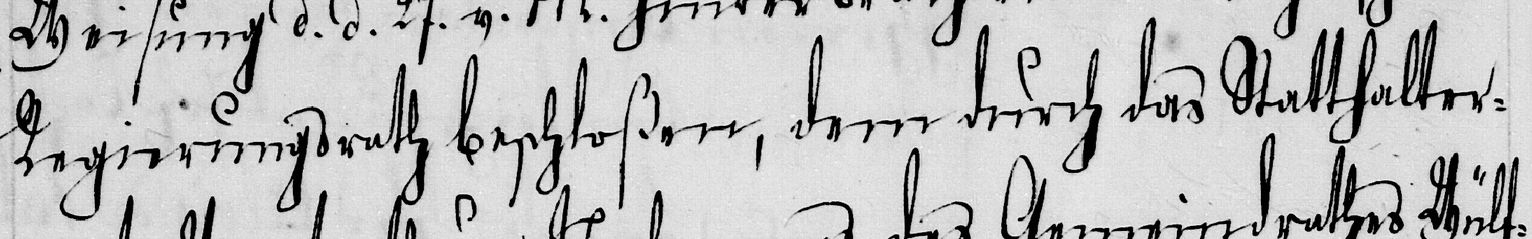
Regierungsrath beschloßen, dem durch das Statthalter¬
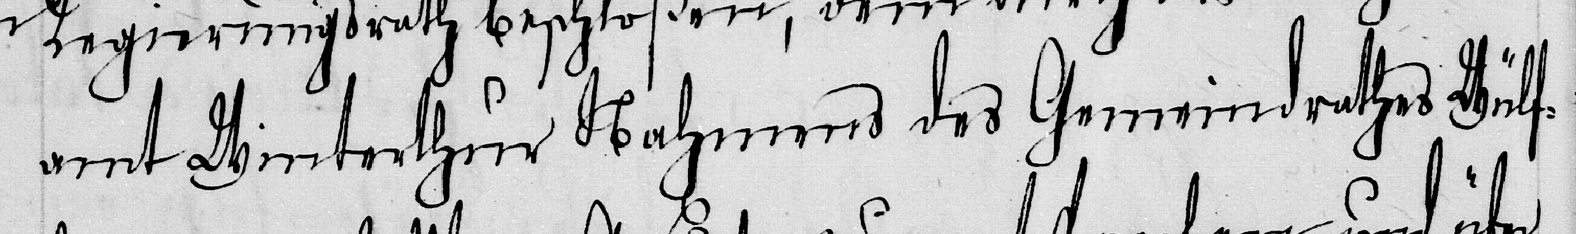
amt Winterthur Nahmens des Gemeindrathes Wülf¬
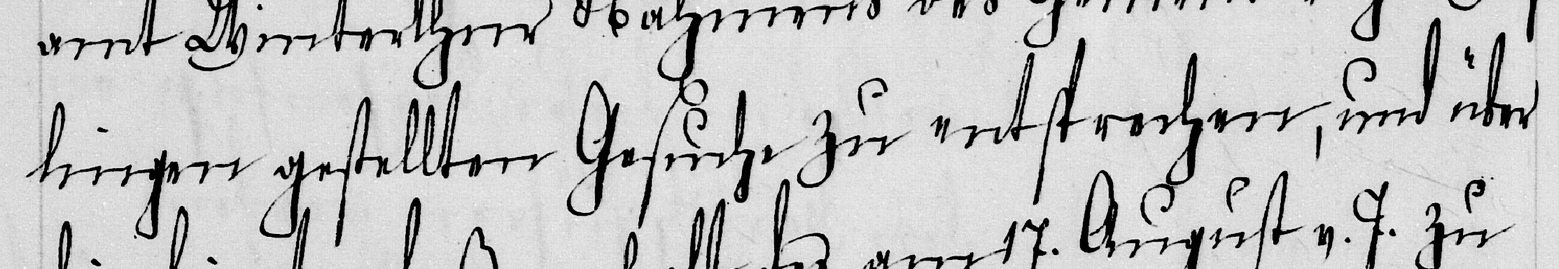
lingen gestellten Gesuche zu entsprechen, und über
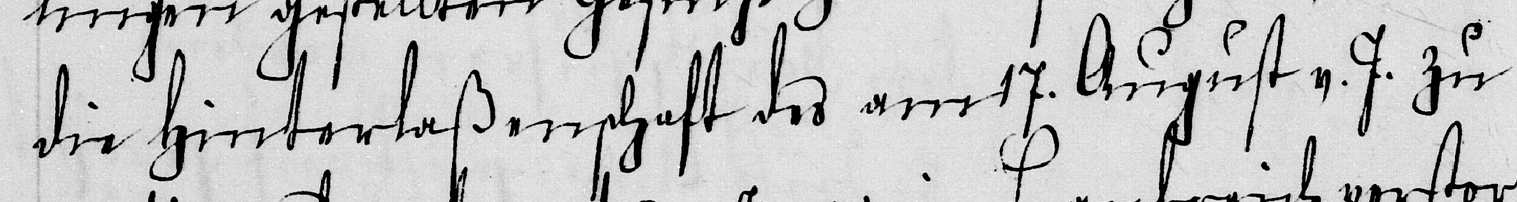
die Hinterlaßenschaft des am 17. August v. J. zu
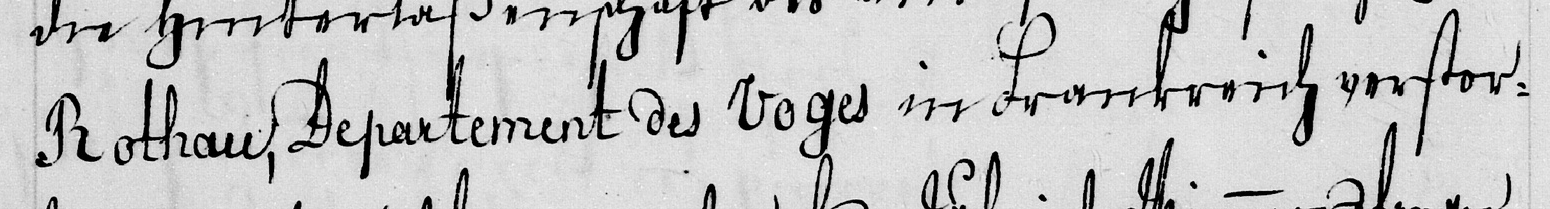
Rothau, Departement des Voges in Frankreich verstor¬
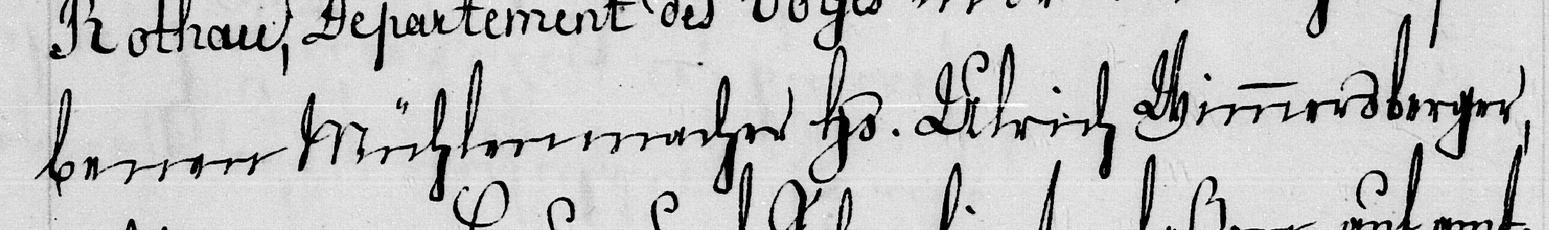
benen Mühlenmacher Hs. Ulrich Wimmersberger,
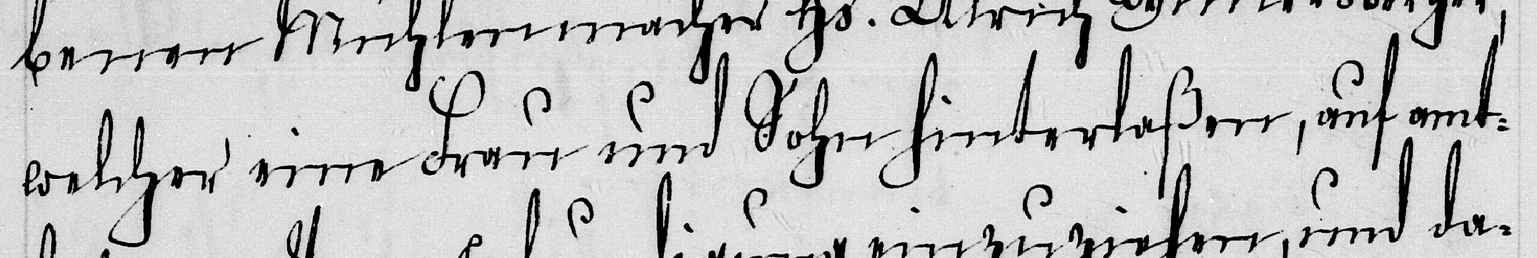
welcher eine Frau und Sohn hinterlaßen, auf amt¬
